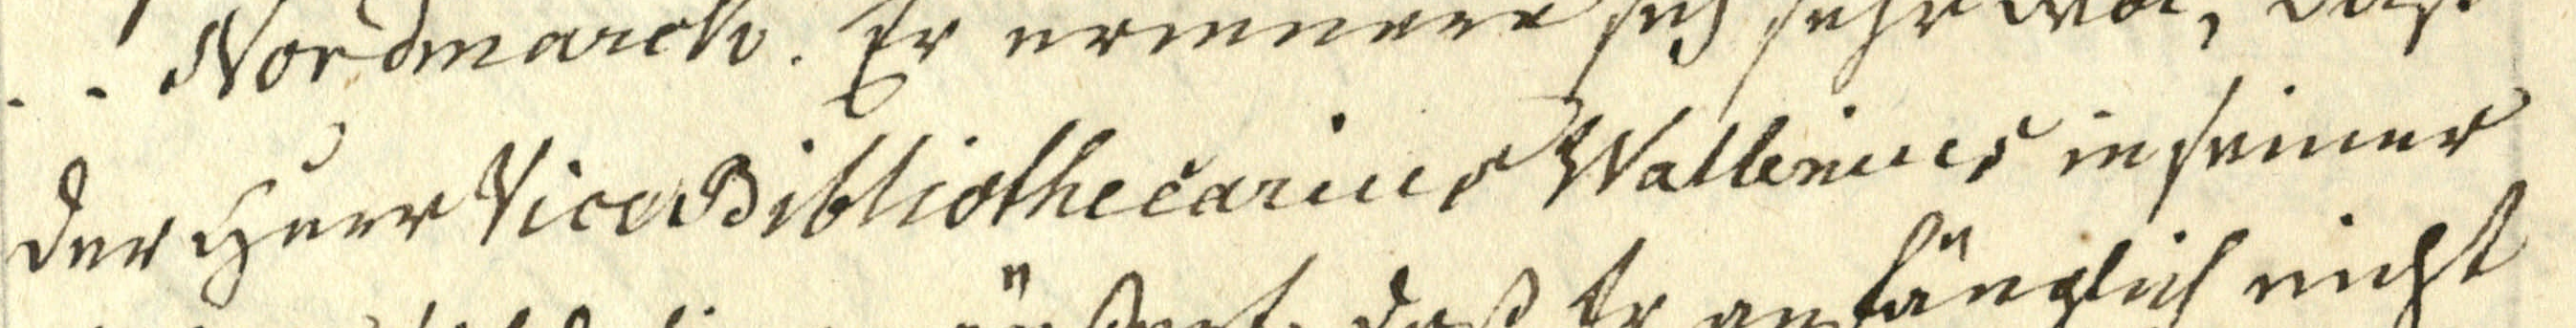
der Herr ViceBibliothecarius Wallenius in seiner
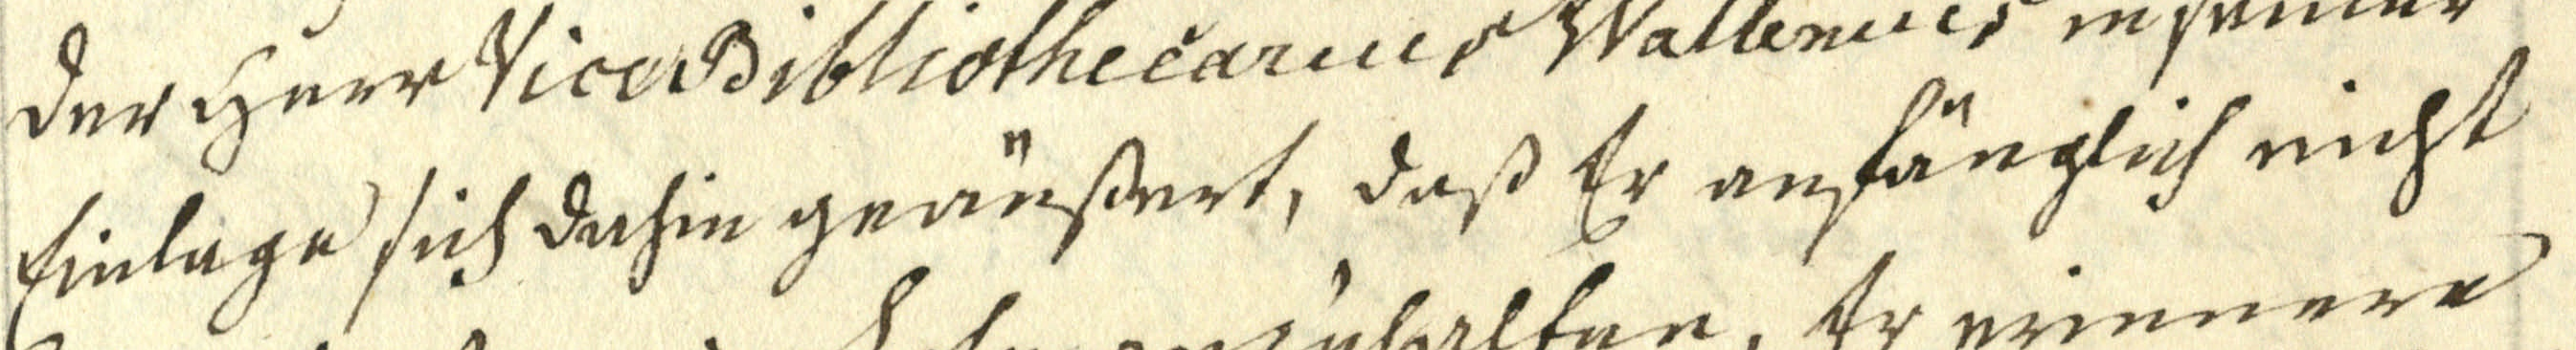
Einlage sich dahin geäußert, daß Er anfänglich nicht
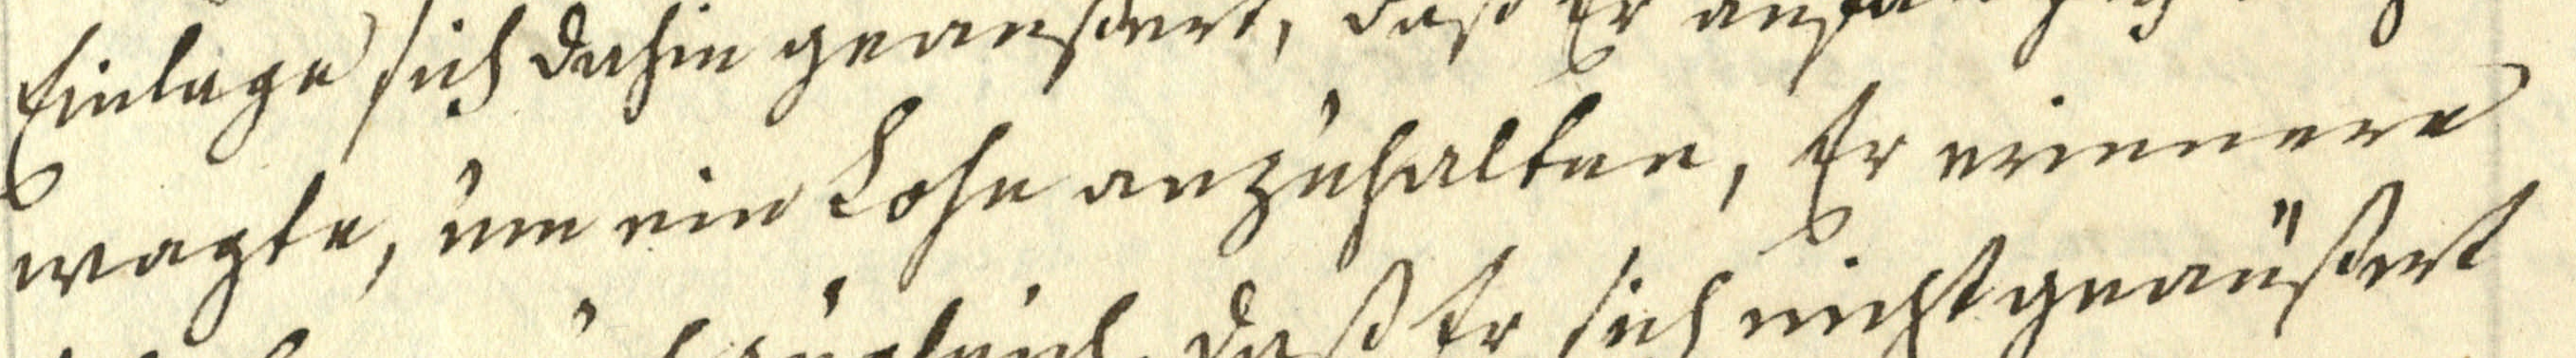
wagte, um ein Lohn anzuhalten, Er erinnere
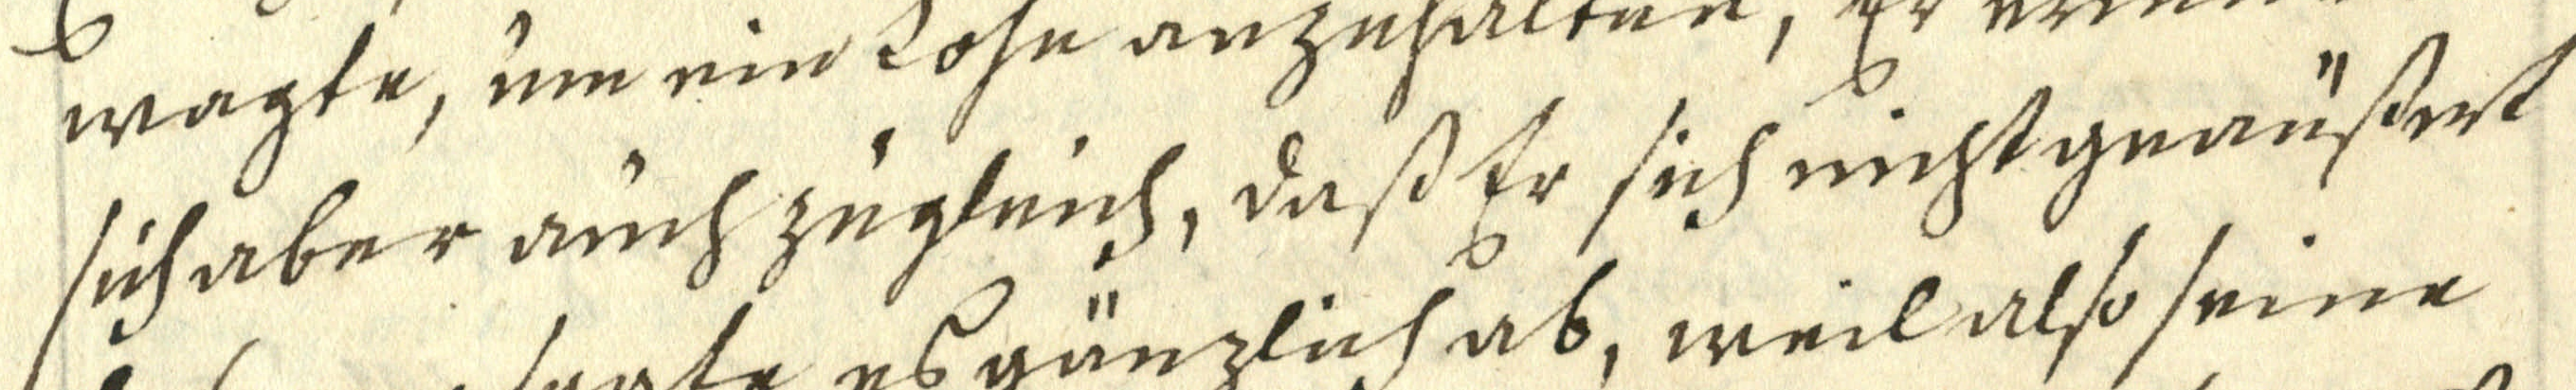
sich aber auch zugleich, daß Er sich nicht geäußert
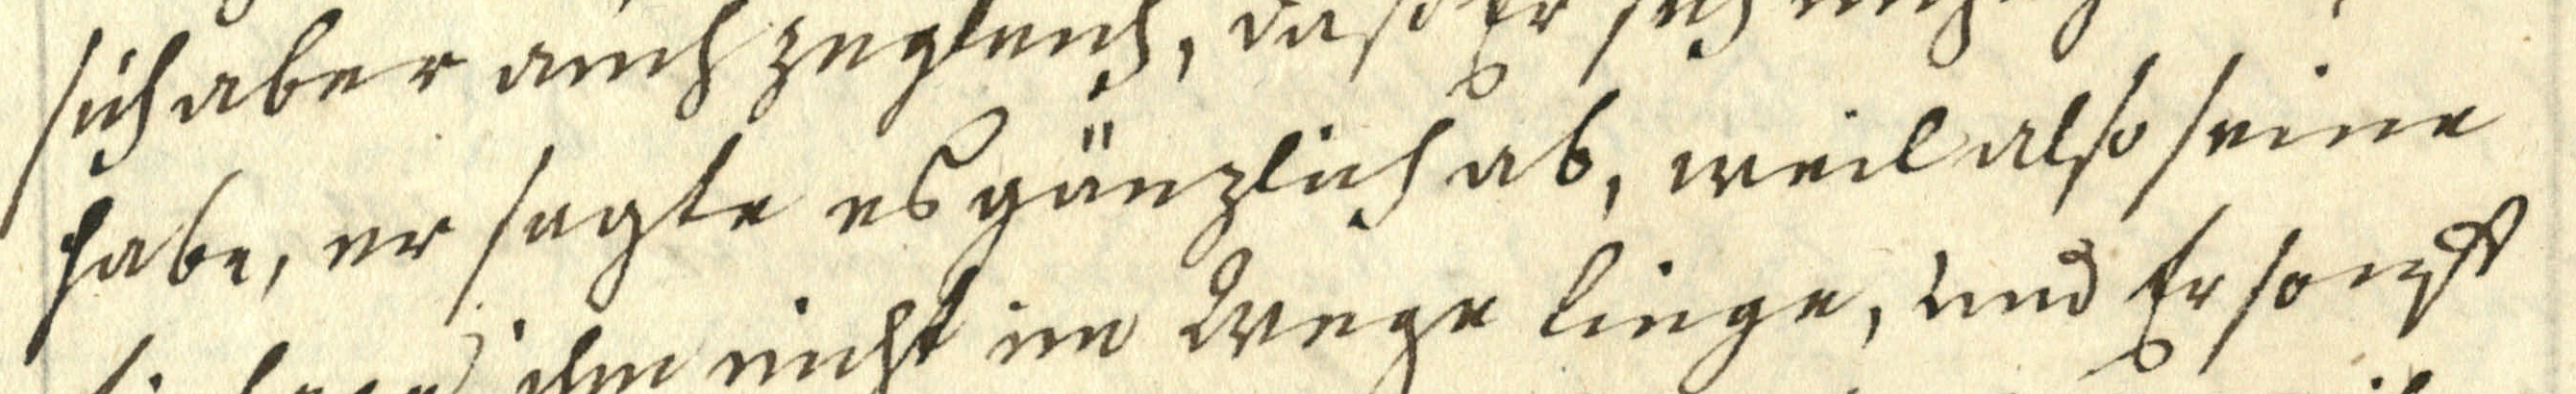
habe, er sagte es gänzlich ab, weil also seine
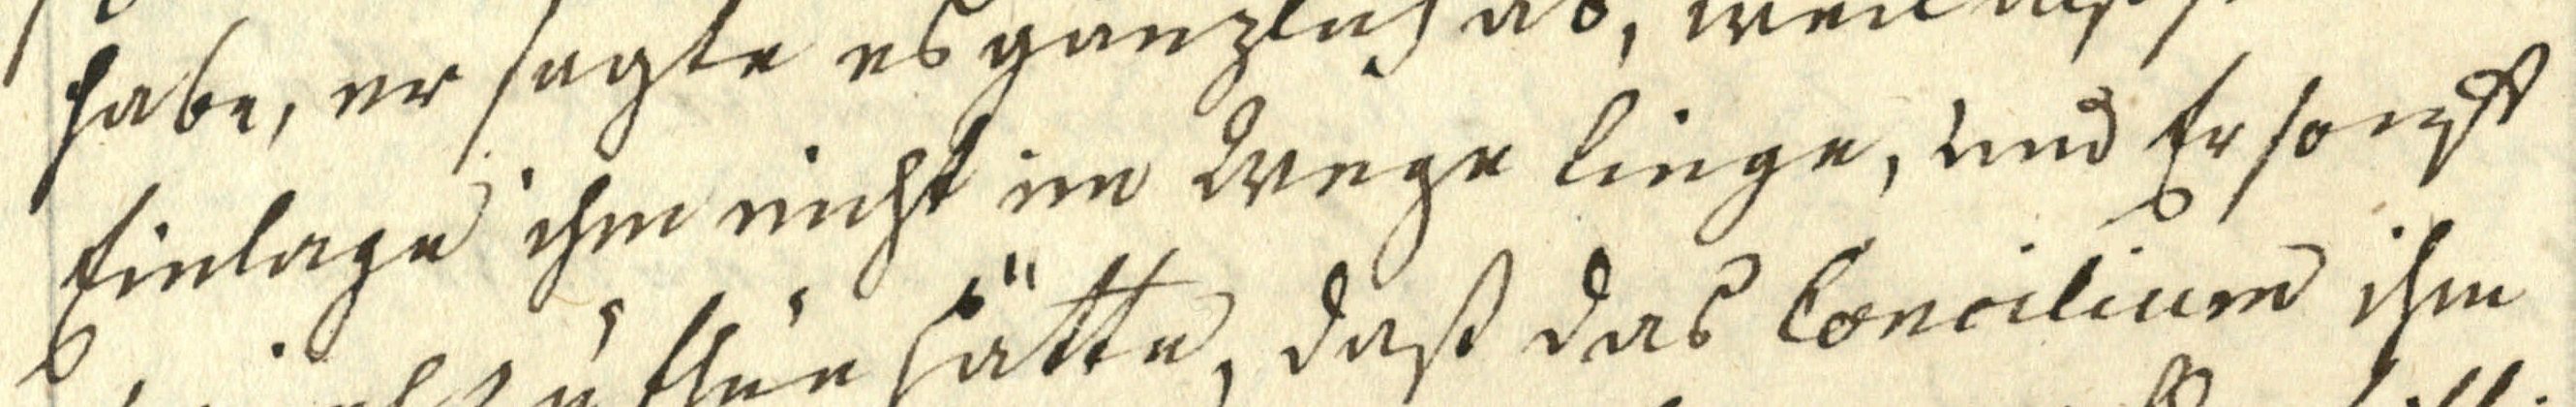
Einlage ihm nicht im Wege liege, und Er soerst
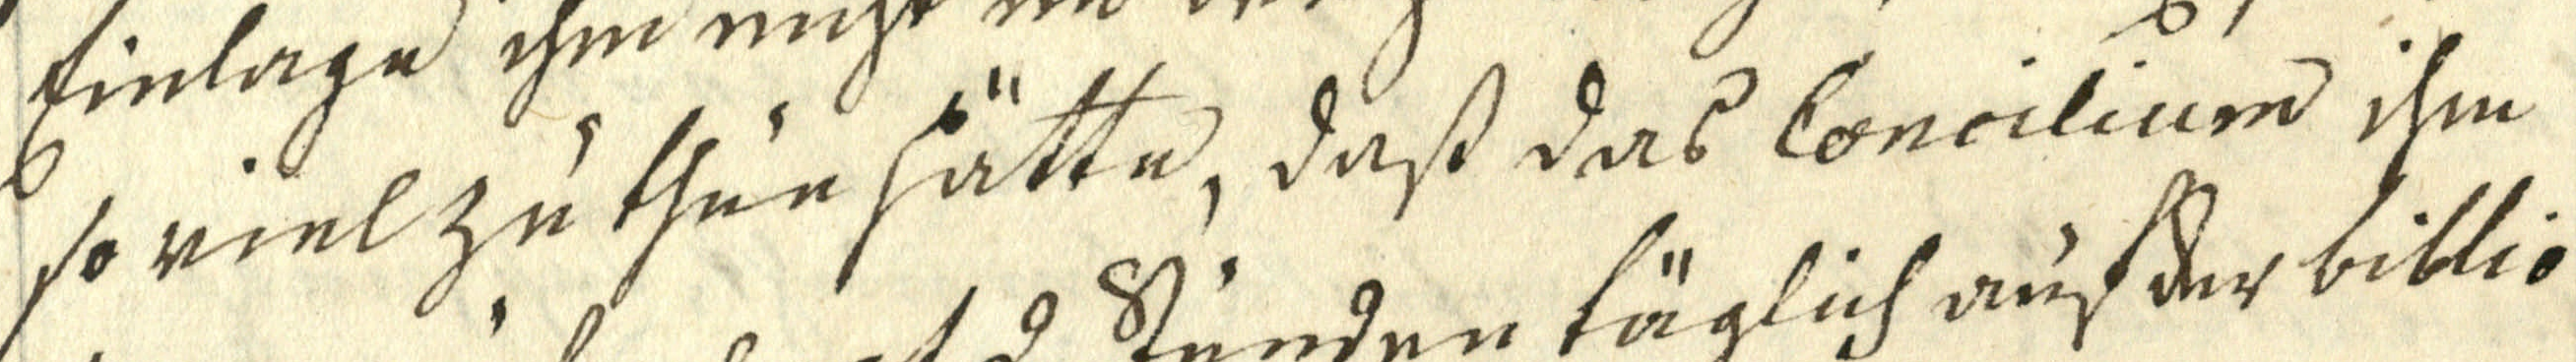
so viel zuthun hätte, daß das Concilium ihm
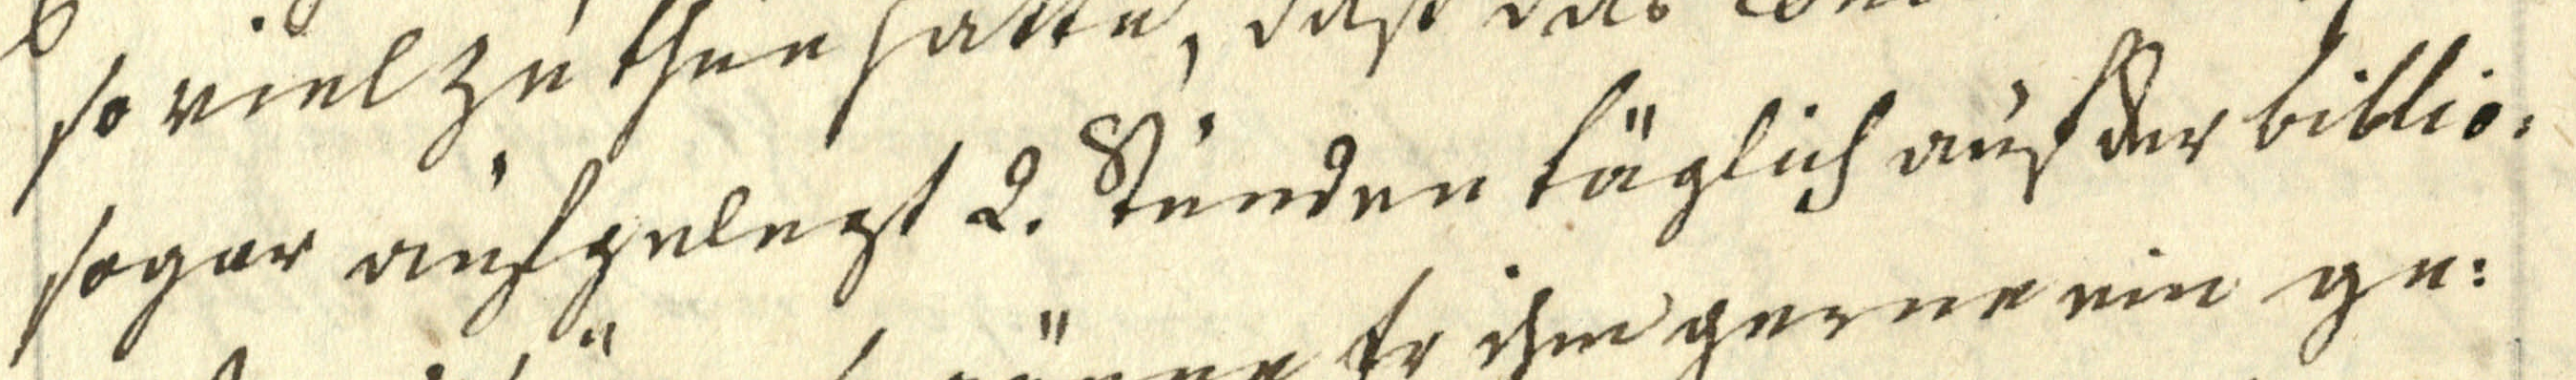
sogar aufgelegt 2. Stunden täglich auf der Biblio¬
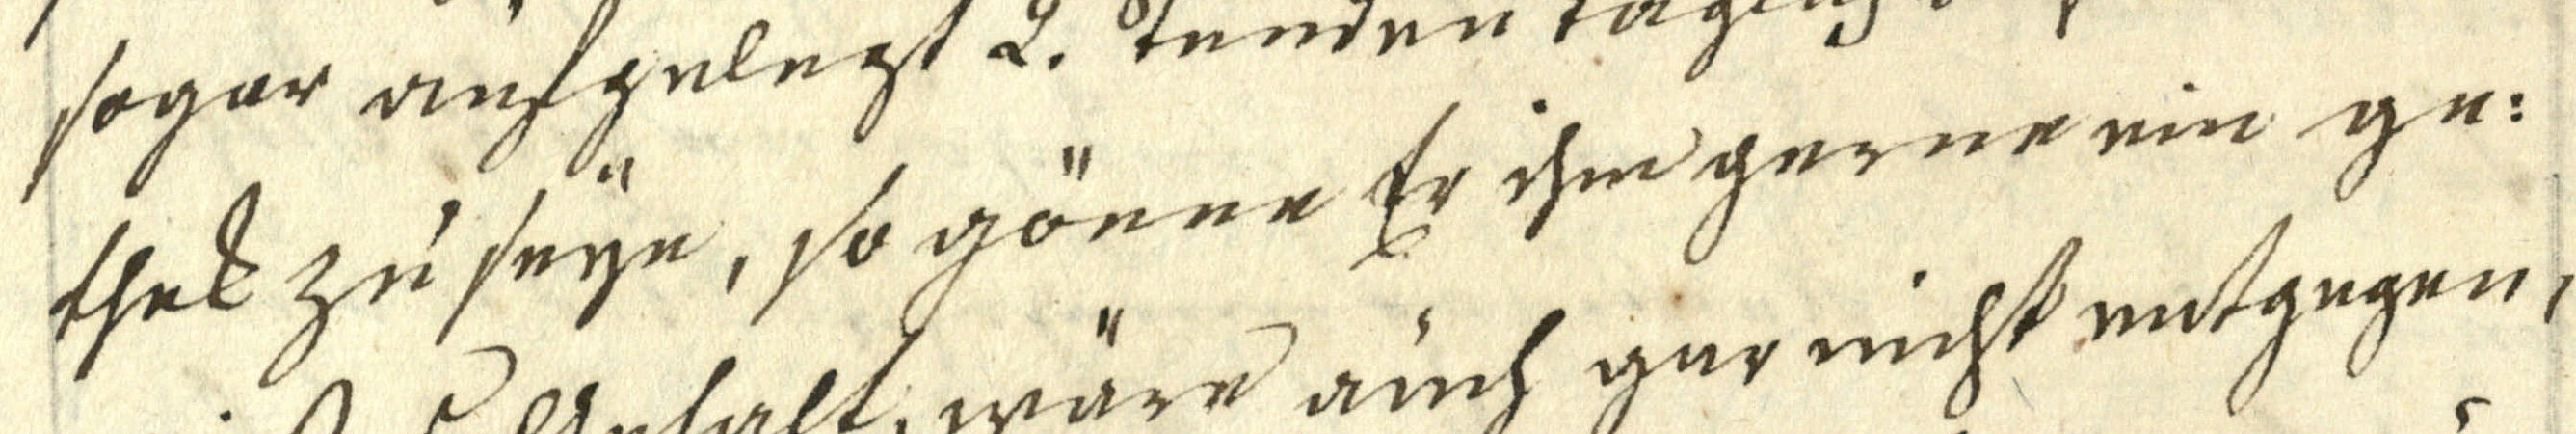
thek zu seÿn, so gönne Er ihm gerne ein ge¬
